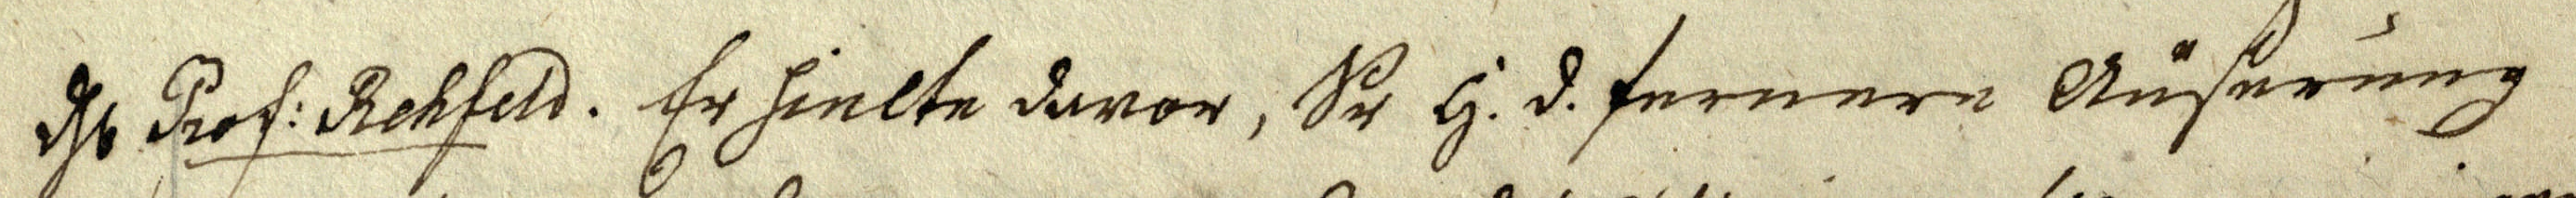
dh. Prof. Rehfeld. Er hielte davor, Sr H. d. fernere Äußerung
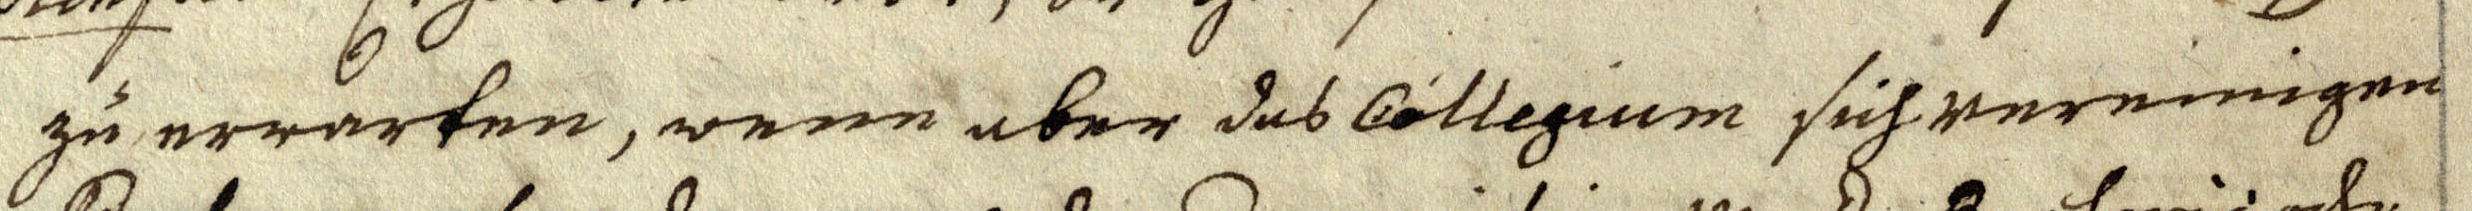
zu erwarten, wenn aber das Collegium sich vereinigen
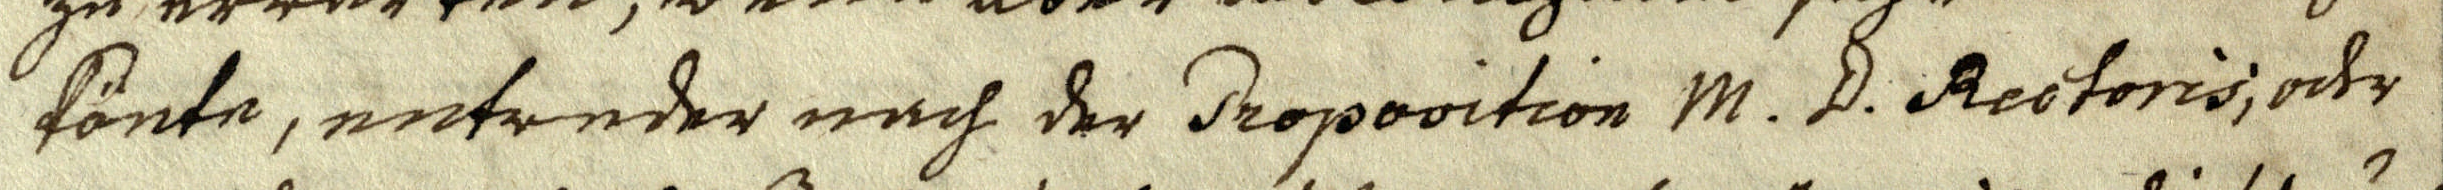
könte, entweder nach der Proposition M. D. Rectoris, oder
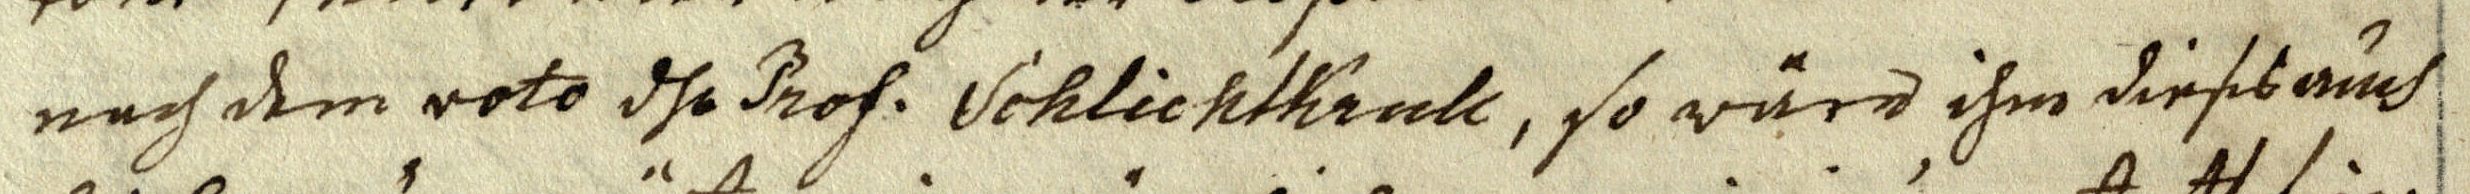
nach dem voto dh. Prof. Schlichtkrull, so wäre ihm dieses auch
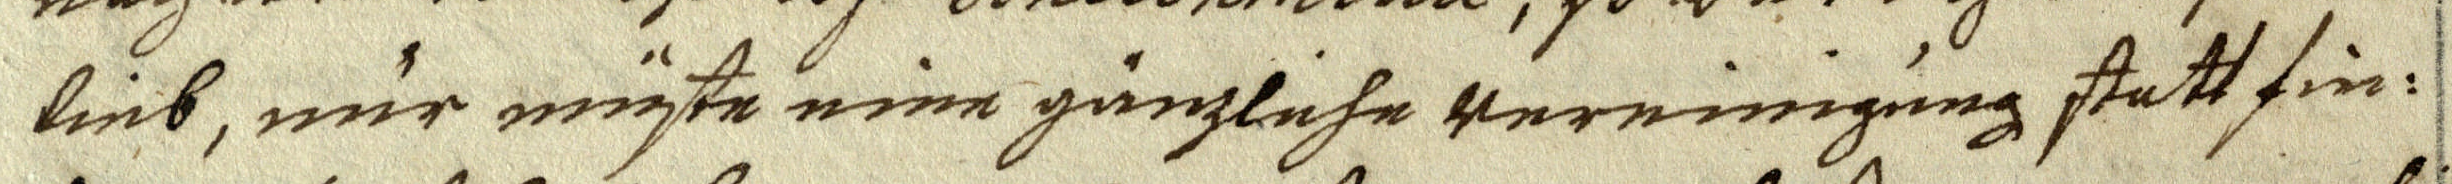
lieb, nur müste eine gänzliche Vereinigung stattfin¬
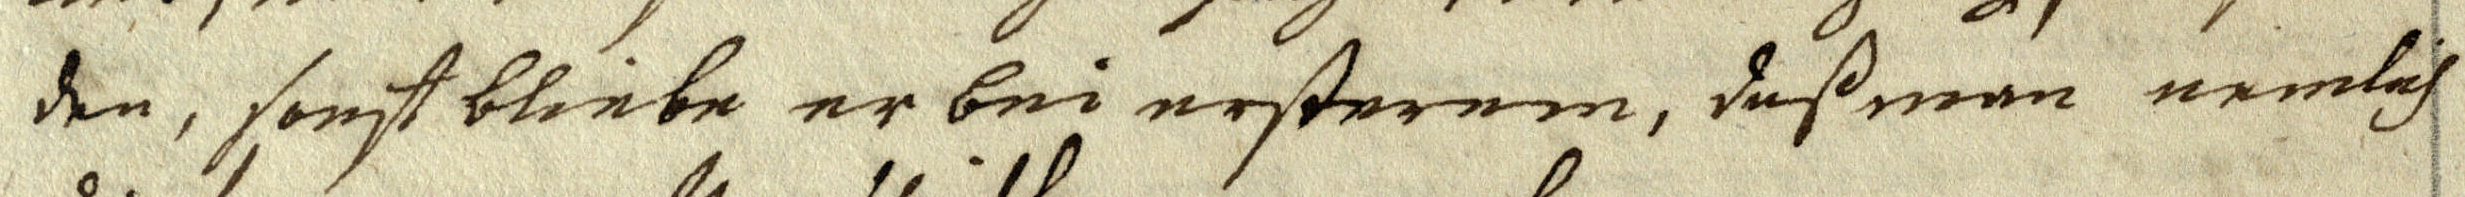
den, sonst bliebe er bei ersterem, daß man nemlich
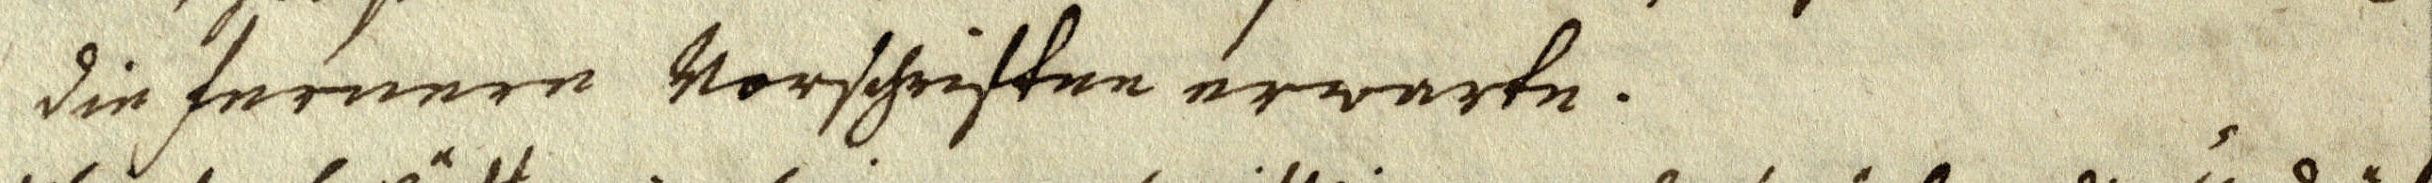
die ferneren Vorschriften erwarte.
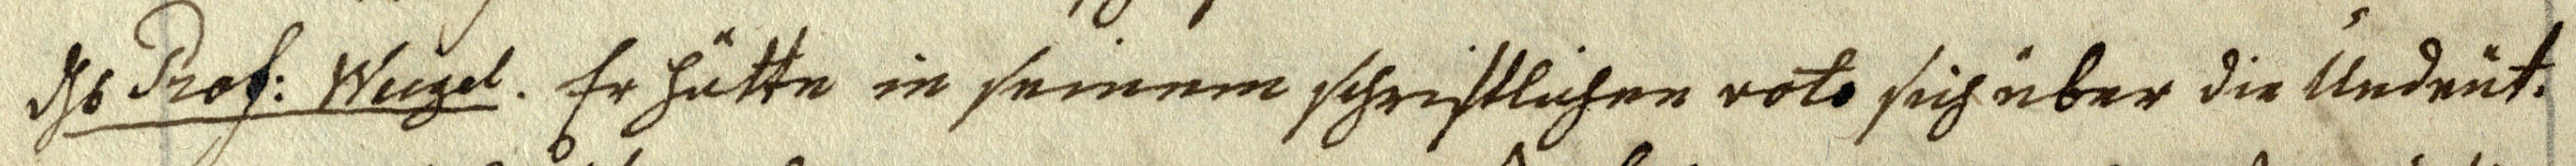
dh. Prof. Weigel. Er hätte in seinem schriftlichen voto sich über die Undeut¬
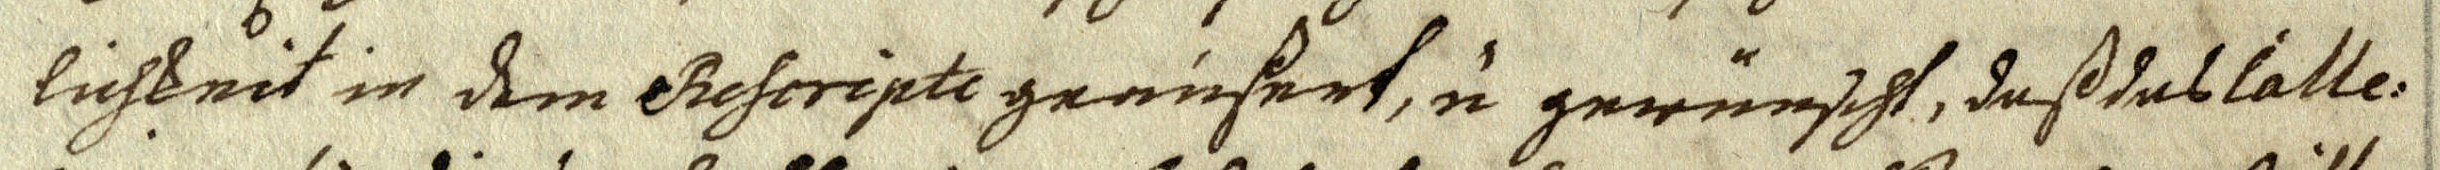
lichkeit in dem Rescripte geäußert, u gewünscht, daß das Colle¬
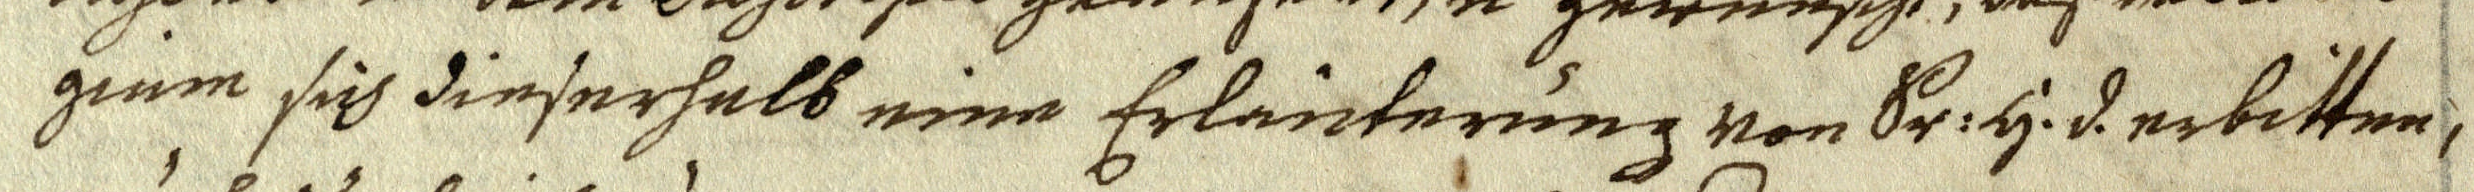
gium sich dieser halb eine Erläuterung von Sr. H. d. erbitten,
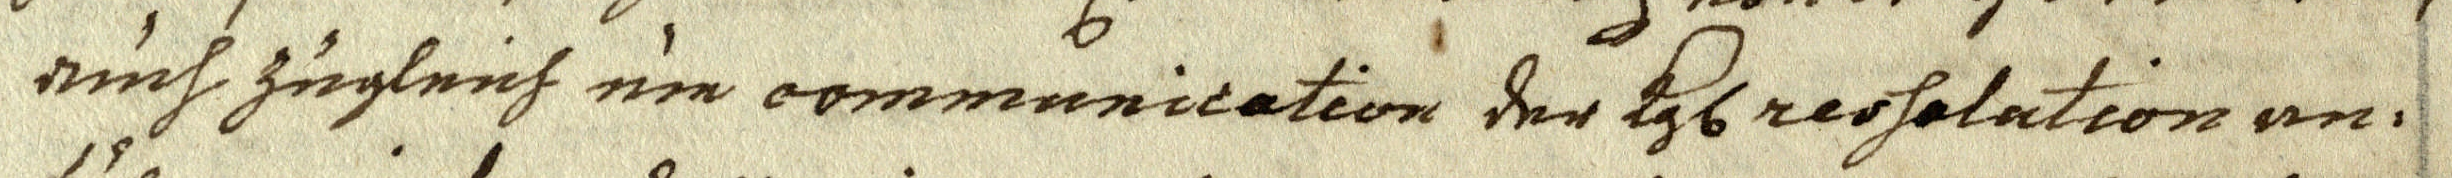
auch zugleich eine communication der Kgl resolution an¬
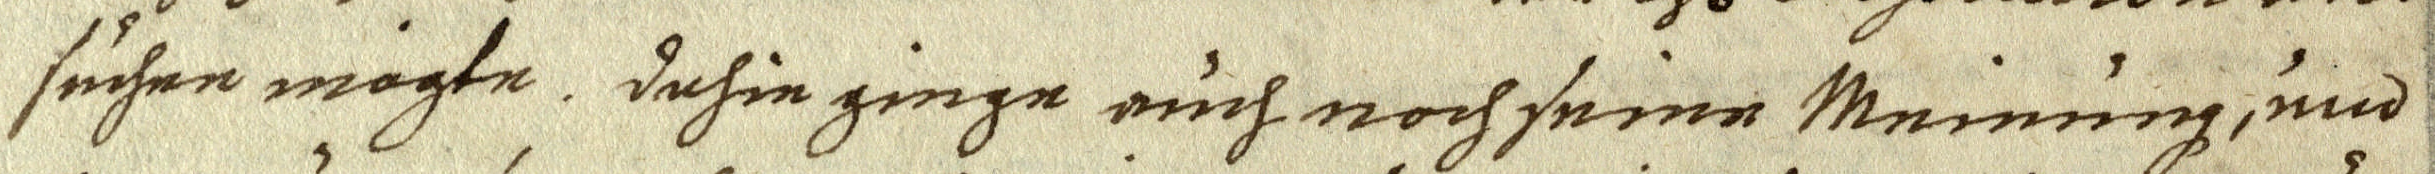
suchen mögte. Dahin ginge auch noch seine Meinung, und
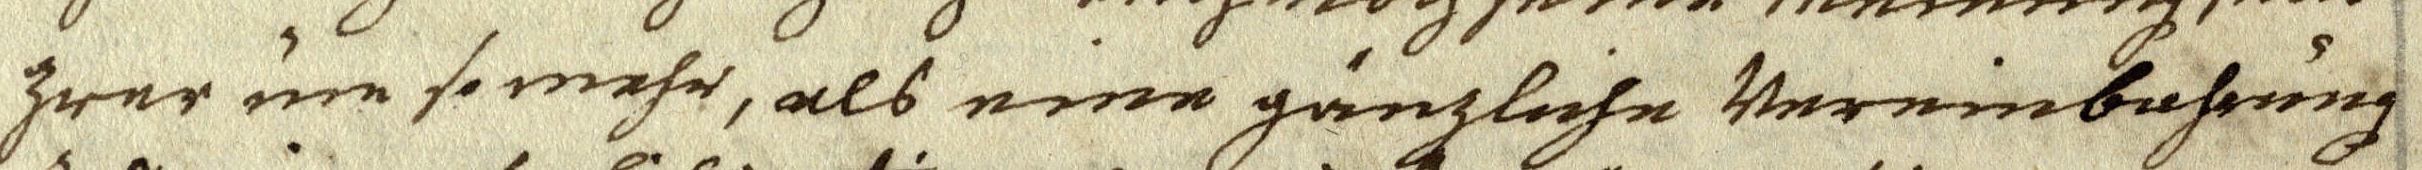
zwar um so mehr, als eine gänzliche Vereinbahrung
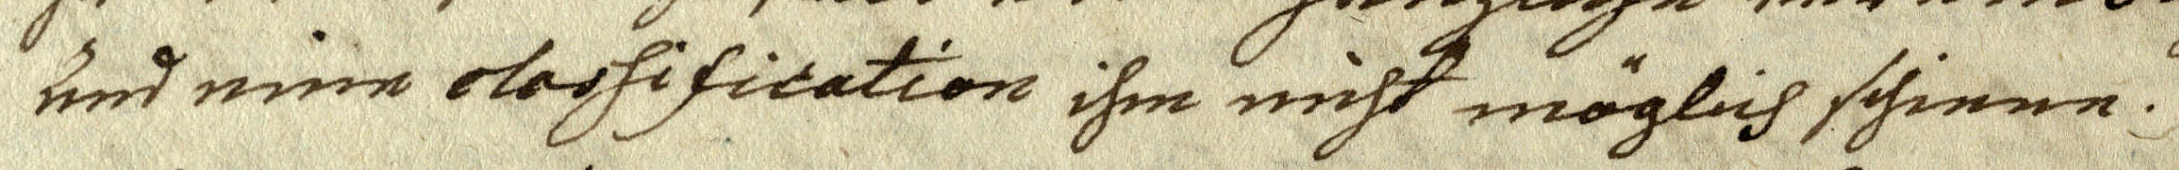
und eine classification ihm nicht möglich schiene.
